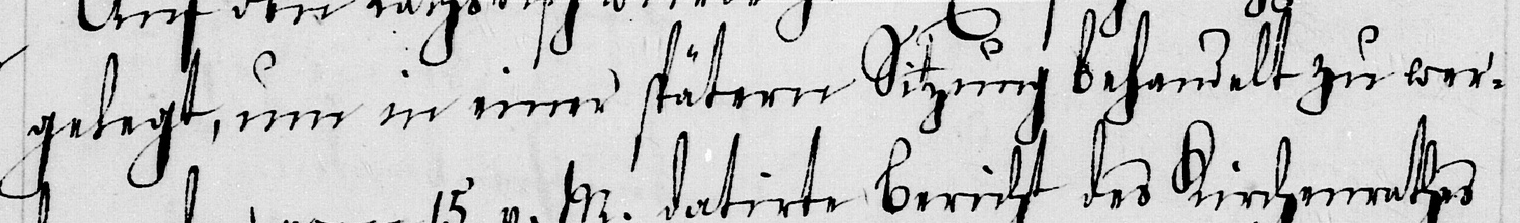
gelegt, um in einer spätern Sitzung behandelt zu wer¬
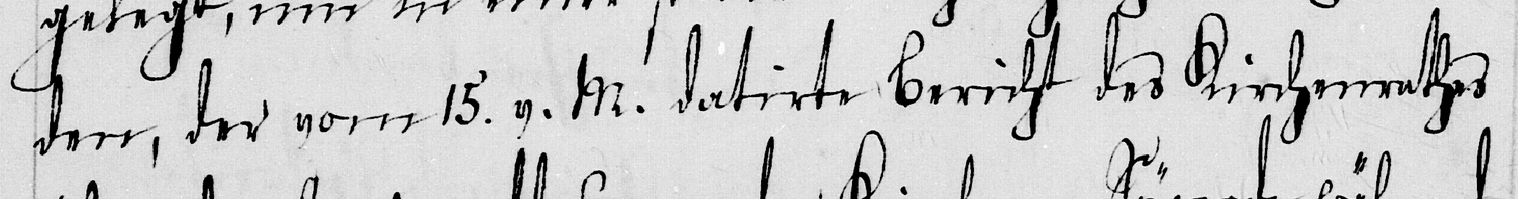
den, der vom 15. v. M. datirte Bericht des Kirchenrathes
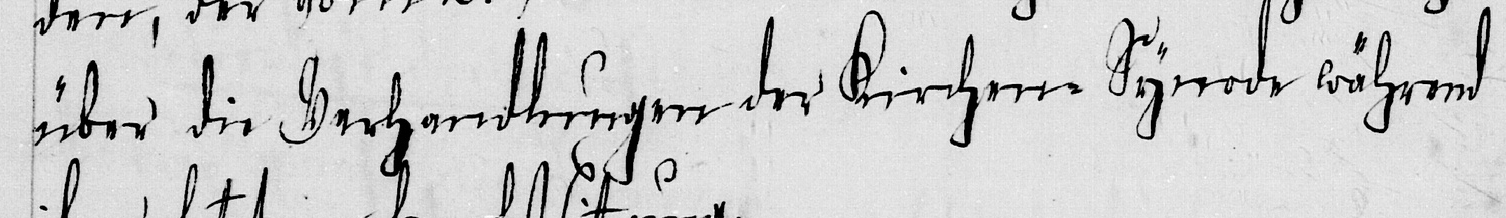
über die Verhandlungen der Kirchen-Synode während
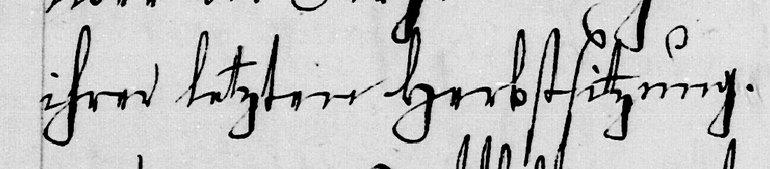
ihrer letzten Herbstsitzung.
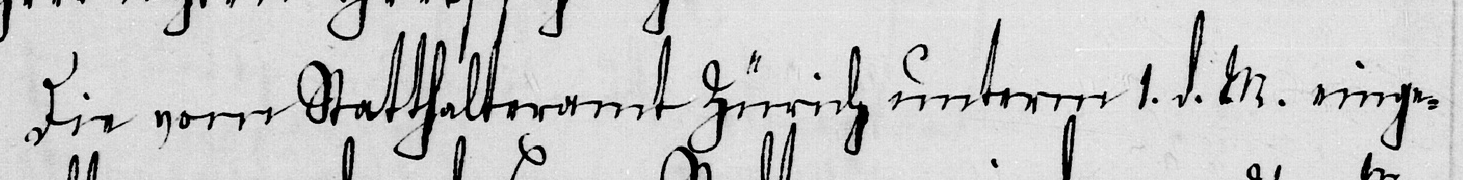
Die vom Statthalteramt Zürich unterm 1. d. M. einge¬
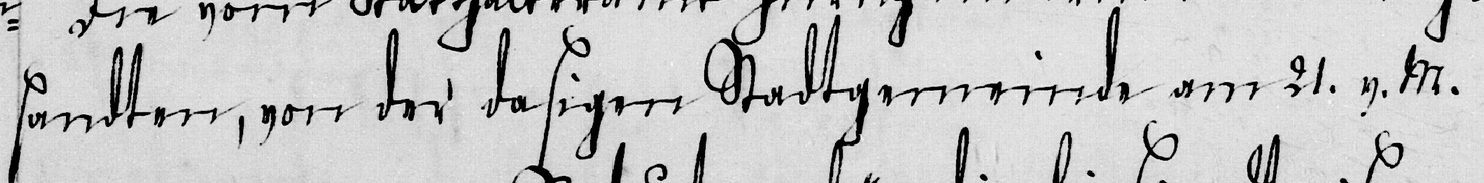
sandten, von der dasigen Stadtgemeinde am 21. v. M.
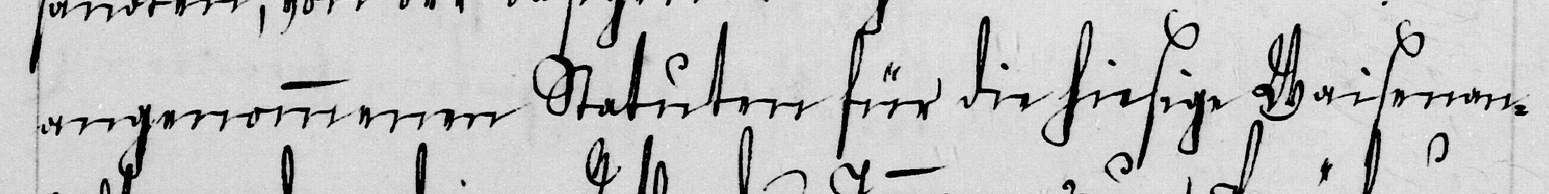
angenommenen Statuten für die hiesige Waisenan¬
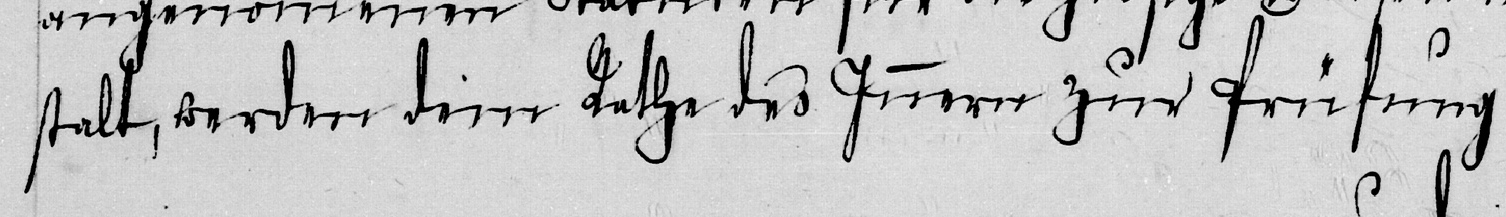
stalt, werden dem Rathe des Innern zur Prüfung
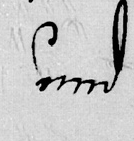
uer
